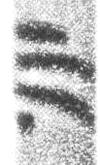天
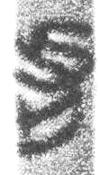道
